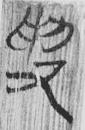受（紂）
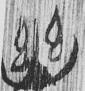幽
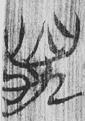萬（厲）
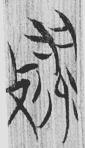○（戮）
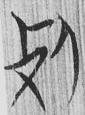死
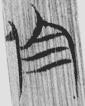於
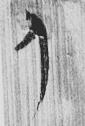人
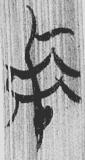手
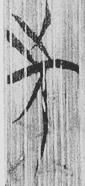先
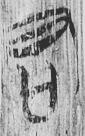君
